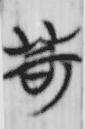苛
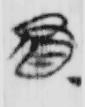冒
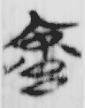舒
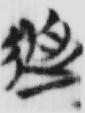逾
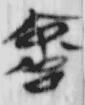舒
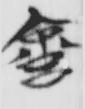舒
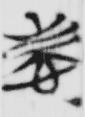慶
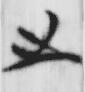之
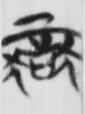獄
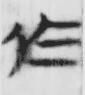於
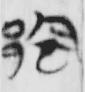陰
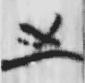之
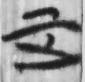正
